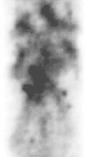常
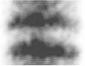二
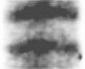二
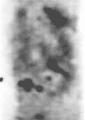紫
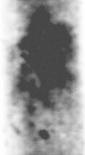○（紕）
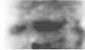二
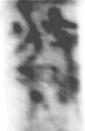○（紛）
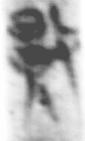敗
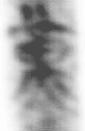黃
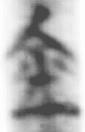金
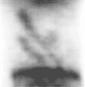之
